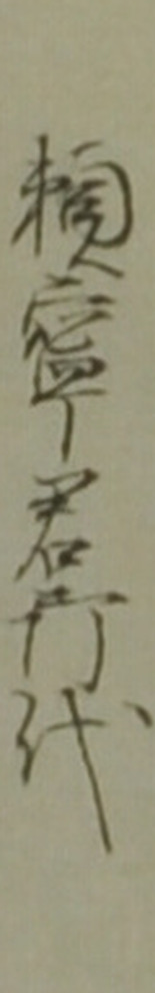頼寧君御代
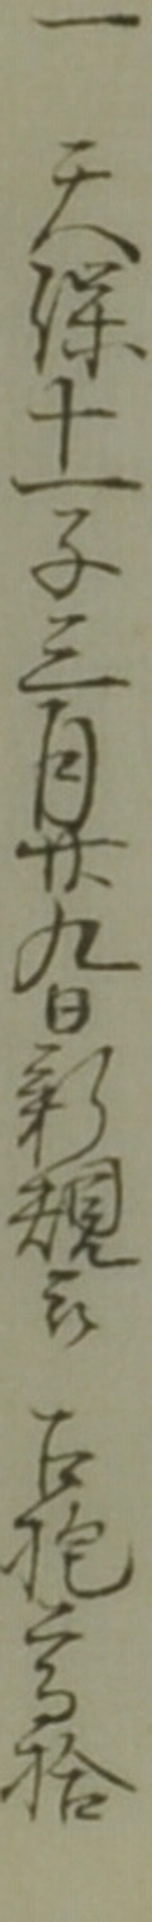一天保十一子三月廿九日新規被召抱高拾
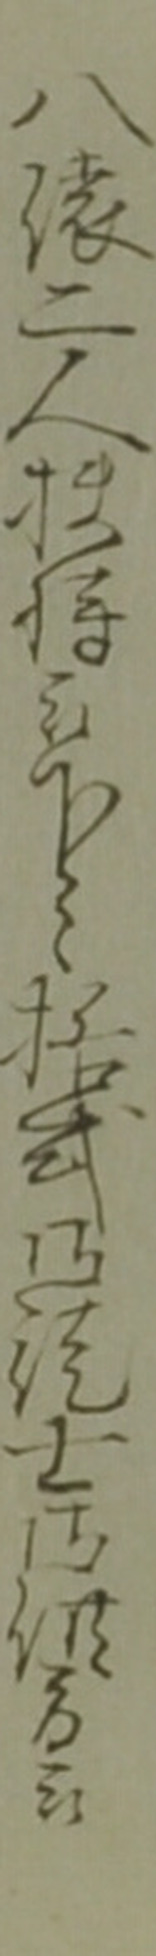八俵二人扶持被下之格式御徒士御供方被
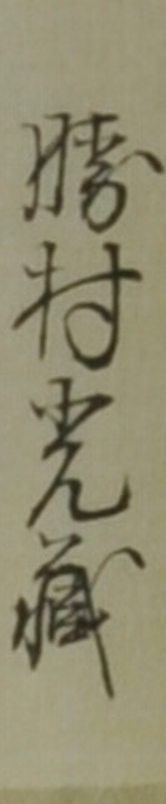勝村光蔵
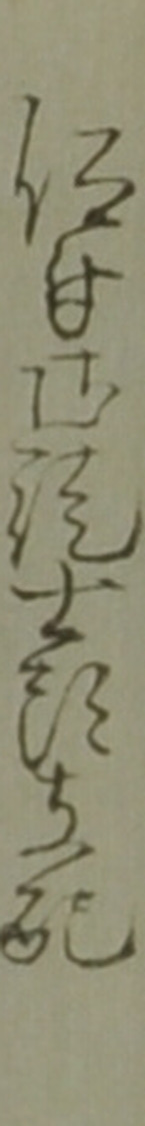仰付御徒士頭支配
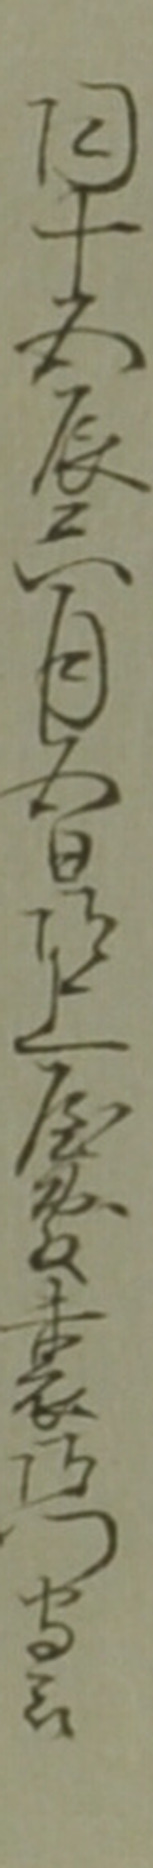一同十五辰六月五日御上屋敷裏御門守被
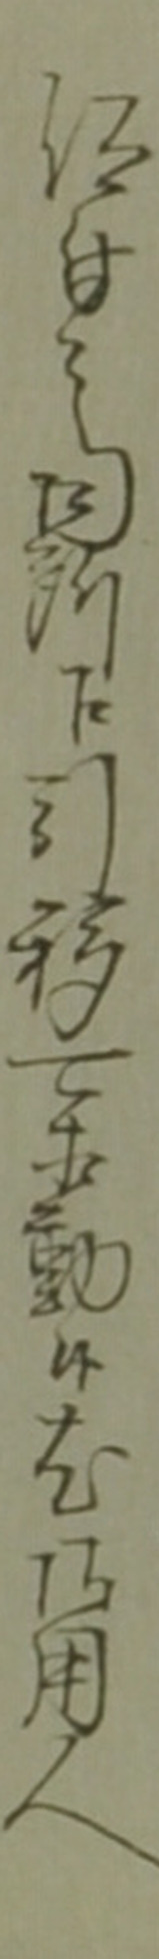仰付之同所江引移可相勤候尤御用人
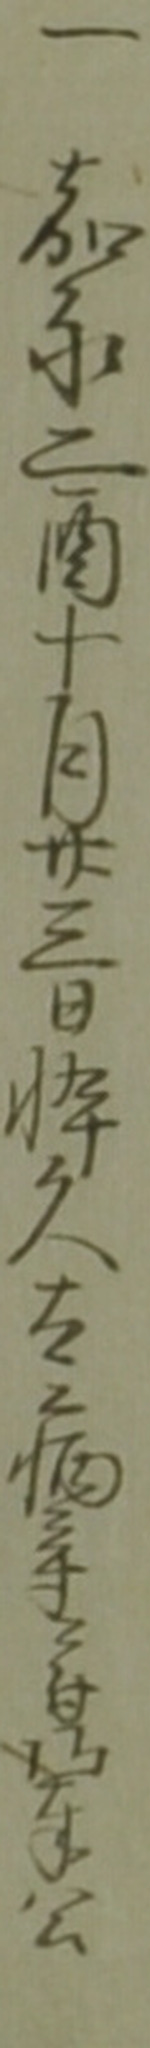一嘉永二酉十月廿三日忰久太病気ニ付御奉公
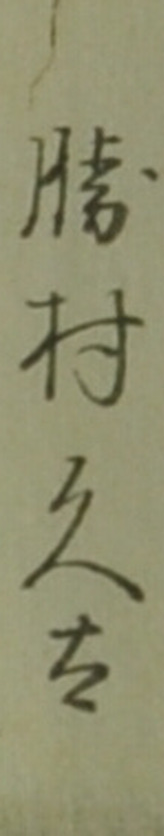勝村久太

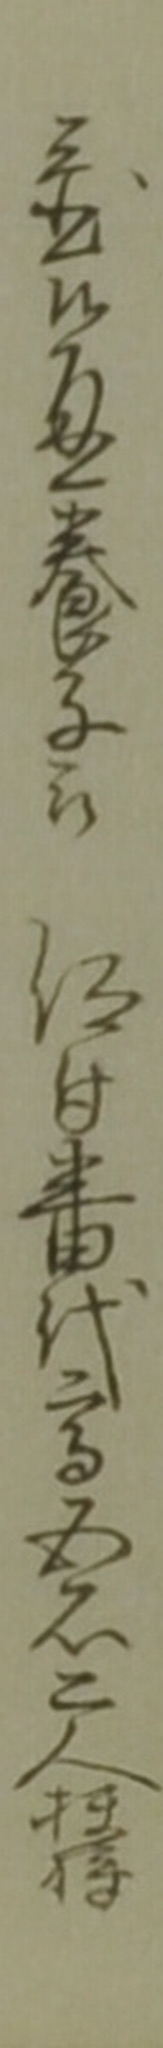置候通養子被仰付番代高五石二人扶持
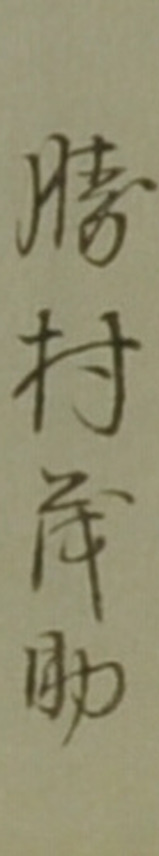勝村茂助
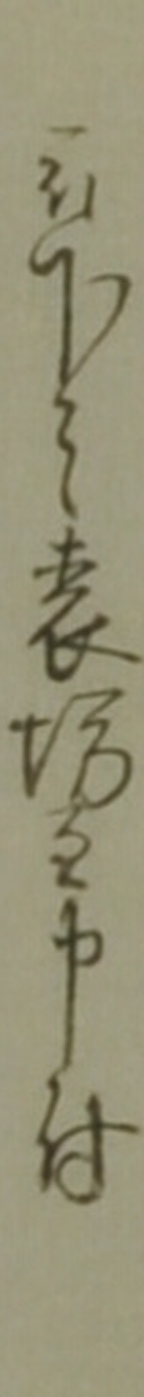被下之表坊主申付
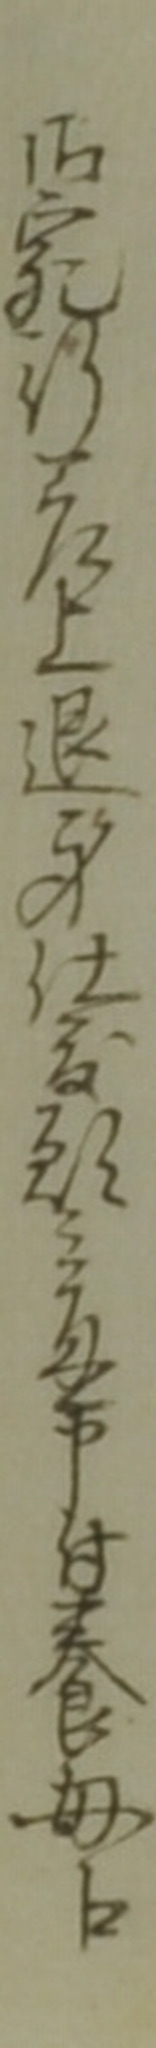御宛行差上退身仕度願之通申付養母江
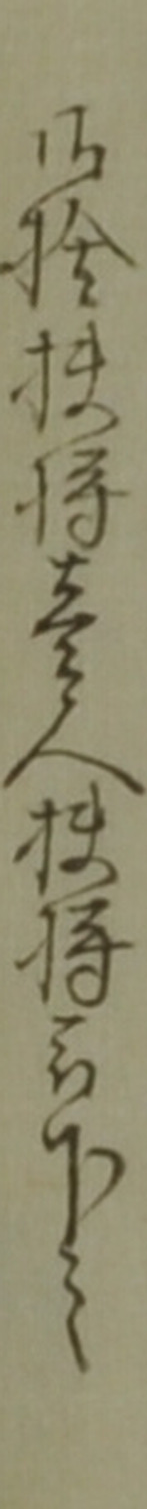御捨扶持壱人扶持被下之
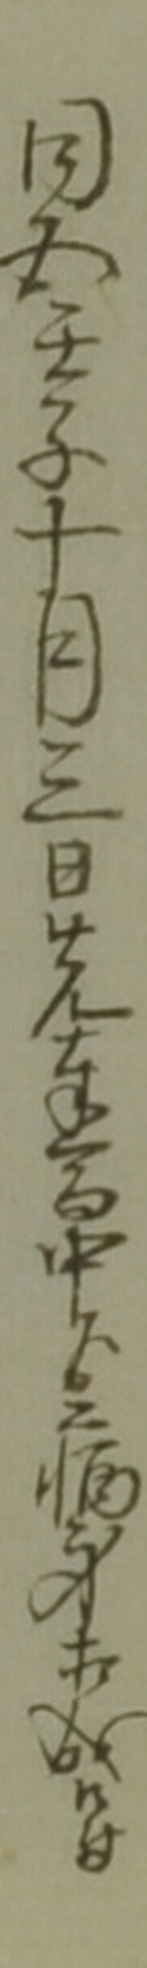一同五壬子十月三日先達而中ゟ病身相成候付
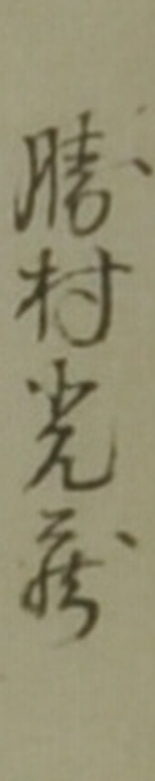勝村光蔵
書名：無足諸士勤仕録（九）
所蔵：伊那市立高遠町図書館・合同会社AMANE
